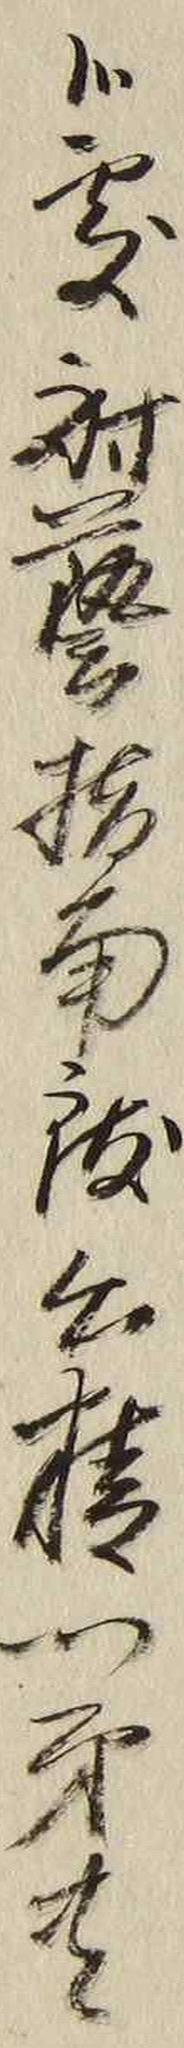候処射芸指南致出精門弟共
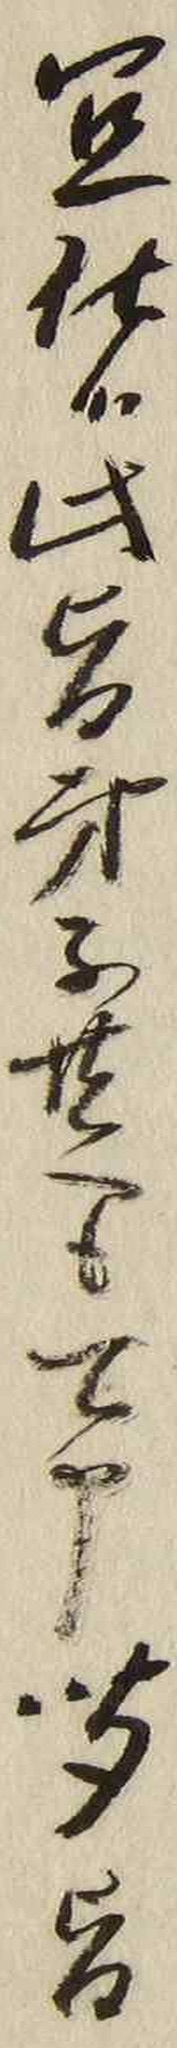宜仕候此旨弟子共へも可申聞旨

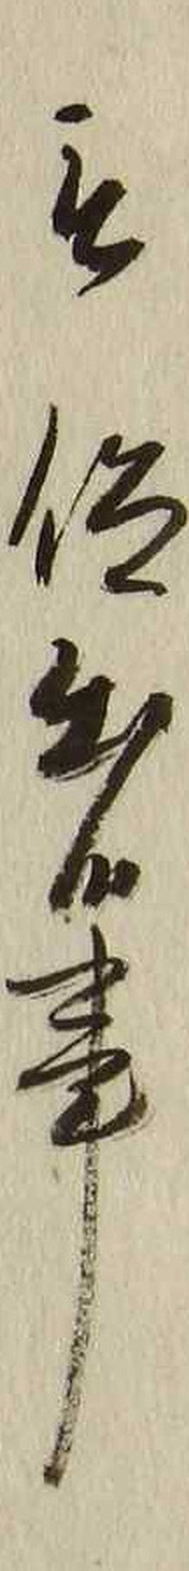被仰出候事
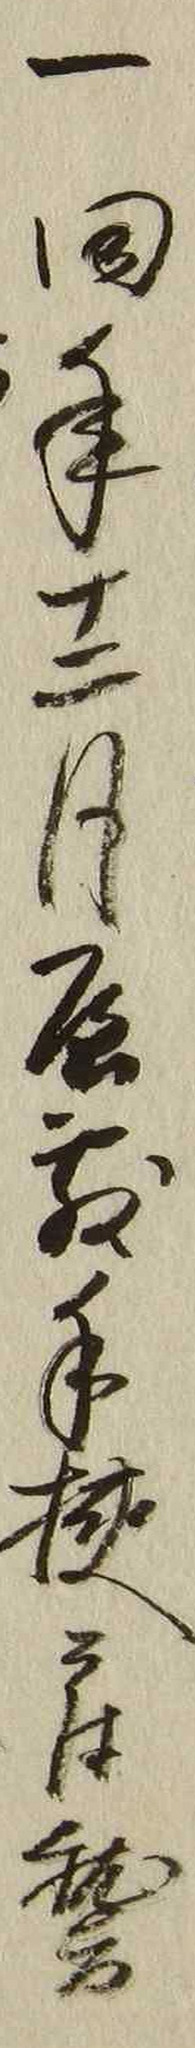一同年十二月屋敷手狭ニ付稽
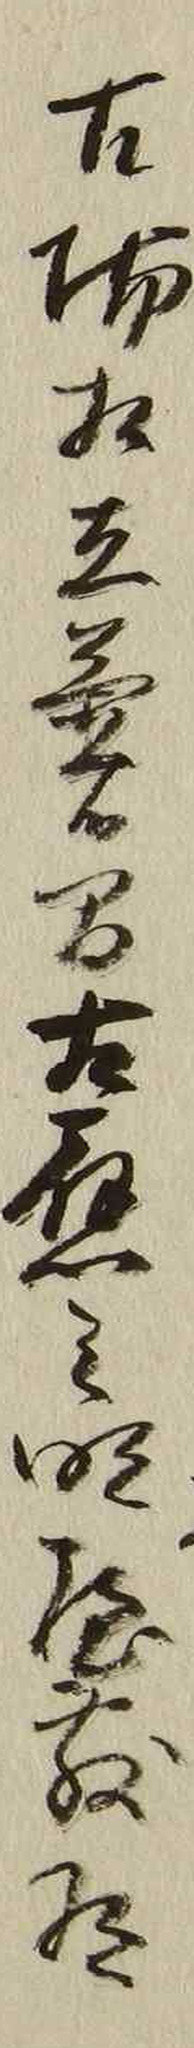古場相立兼候間相応之明屋敷有
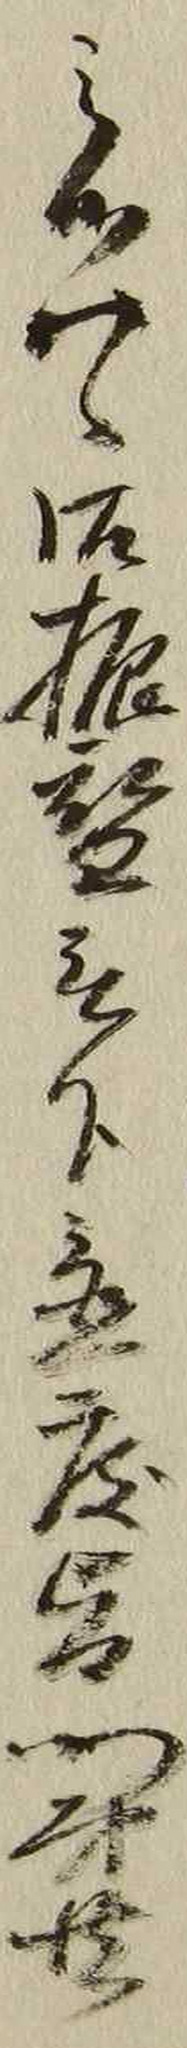之候ハヽ御振替被下置度旨門弟共
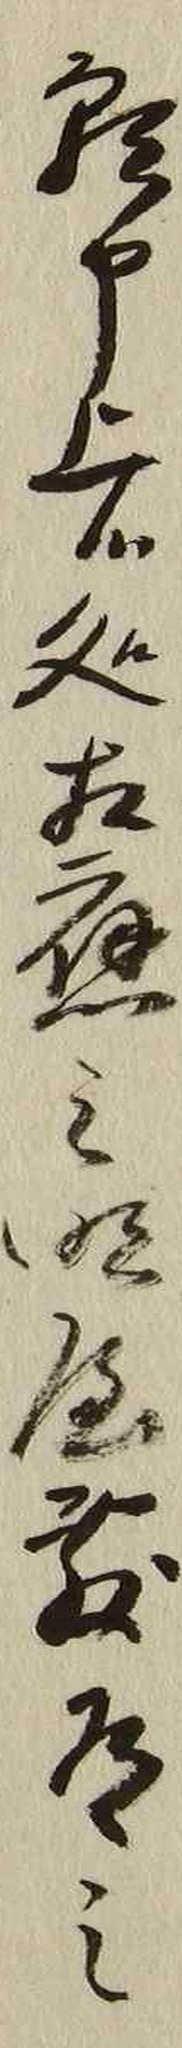願申上候処相応之明屋敷有之
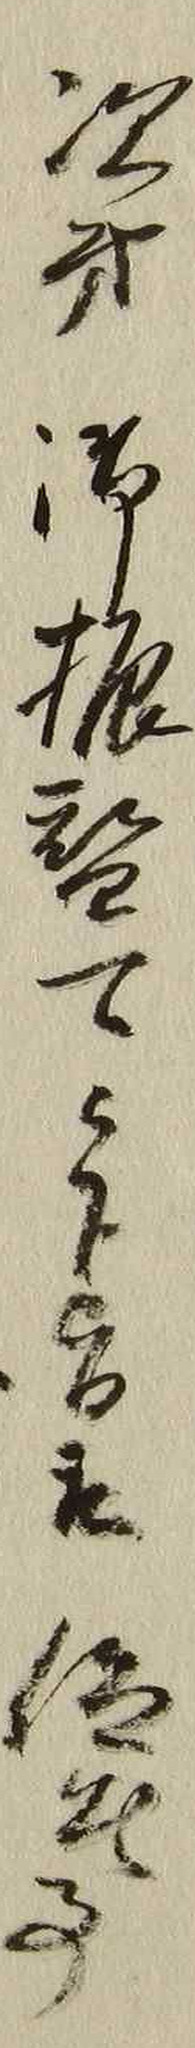次第御振替可被下旨被仰出候事
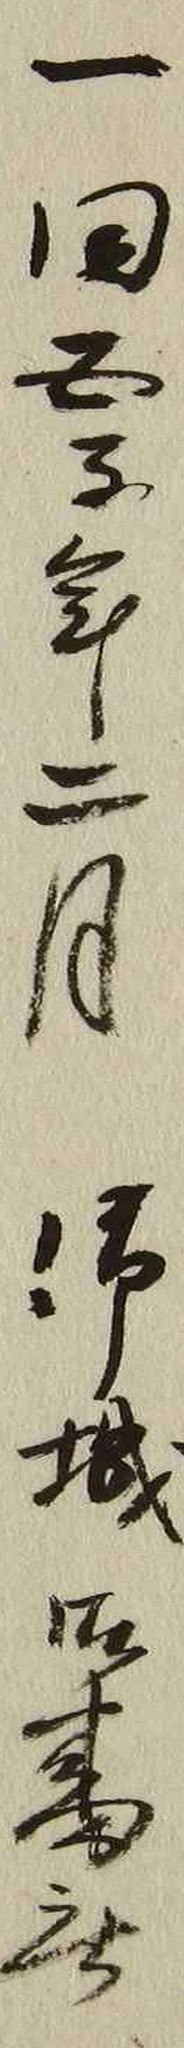一同五子年二月御城御番無
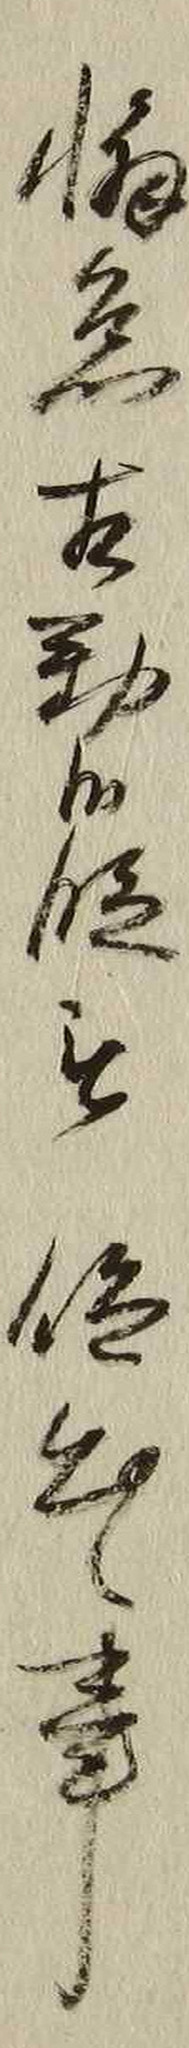懈怠相勤候段被仰出候事
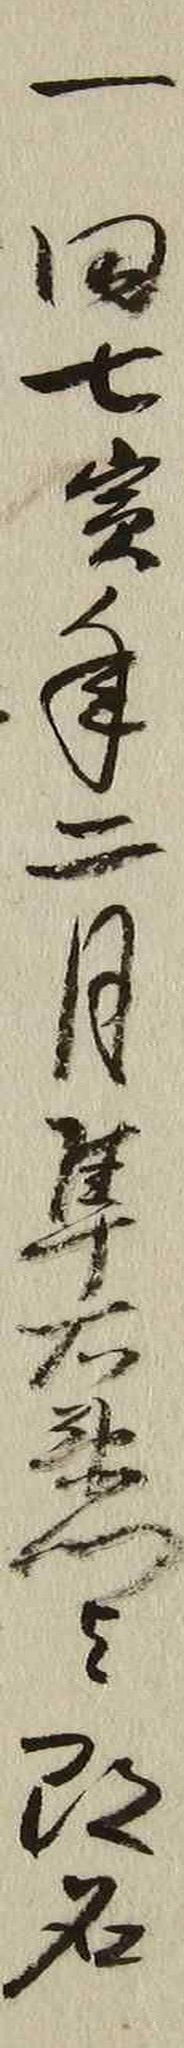一同七寅年二月隼右衛門与改名
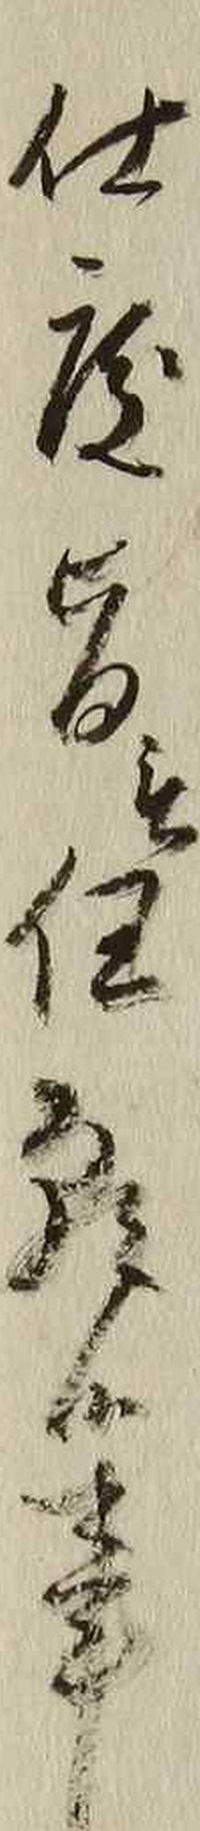仕度旨被任願候事
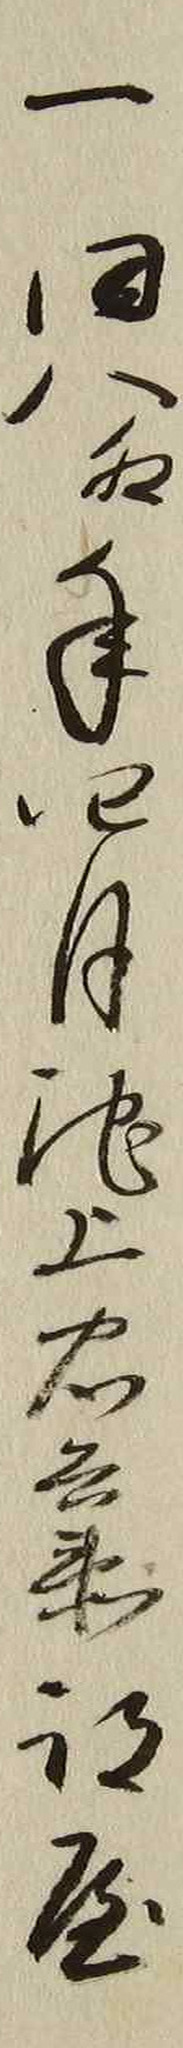一同八卯年四月池上忠兵衛跡屋
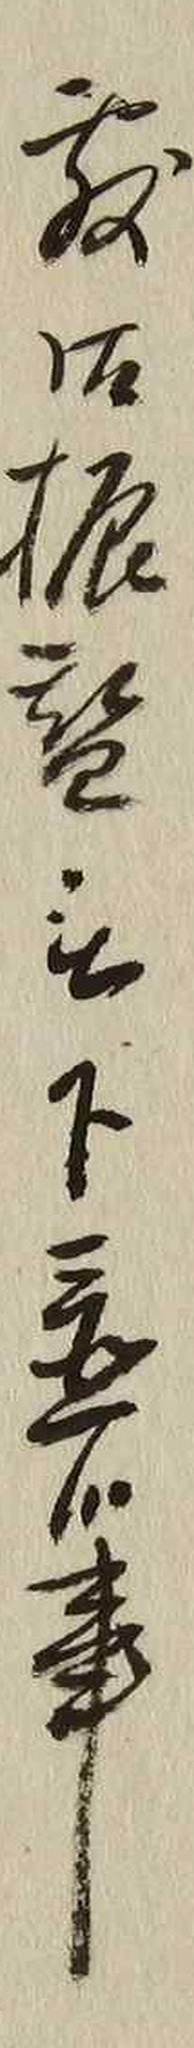敷御振替被下置候事
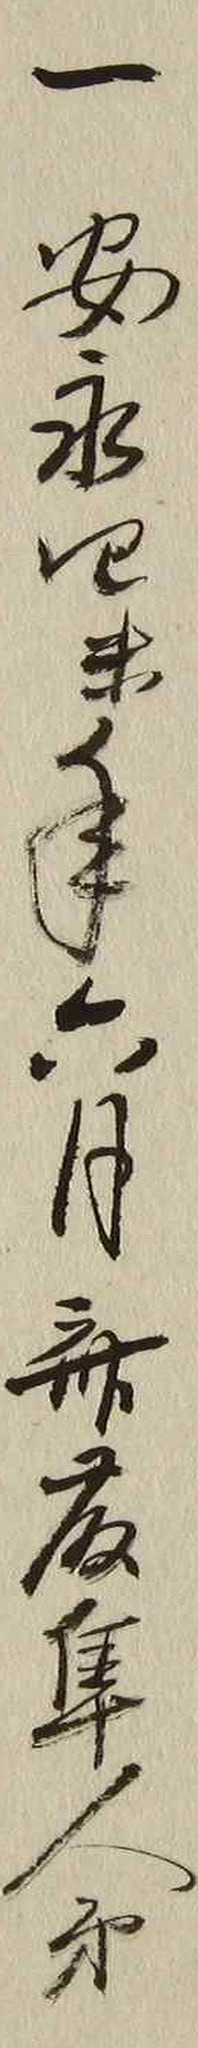一安永四未年六月斎藤隼人弟
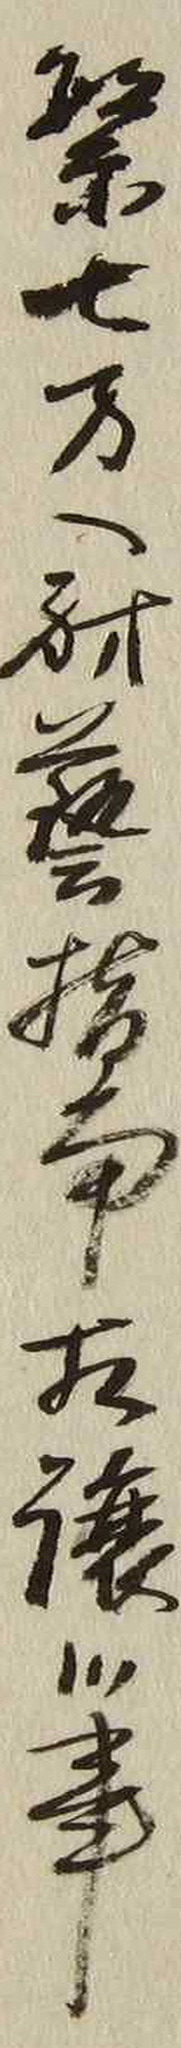繁七方へ射芸指南相譲候事
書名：諸士系譜　巻之346　も之部2
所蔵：会津若松市立会津図書館
